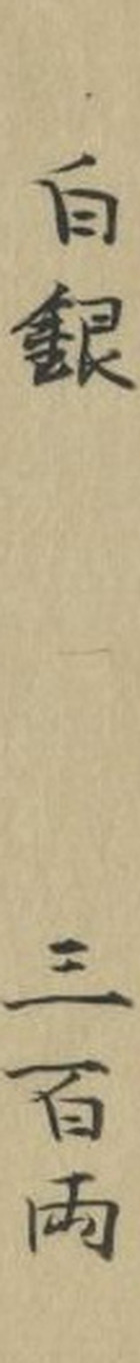白銀三百両
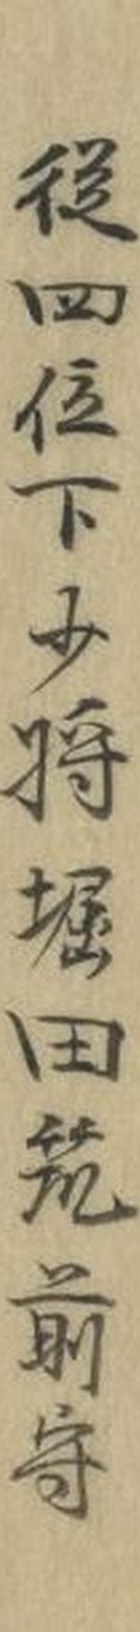従四位下少将堀田筑前守
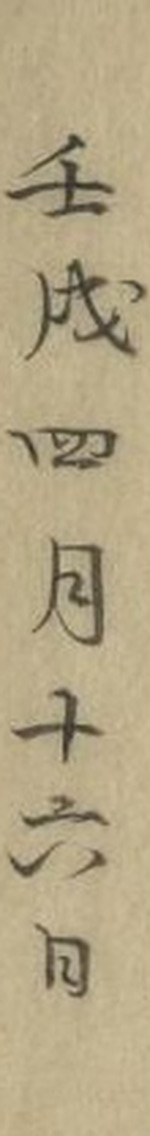壬戌四月十六日
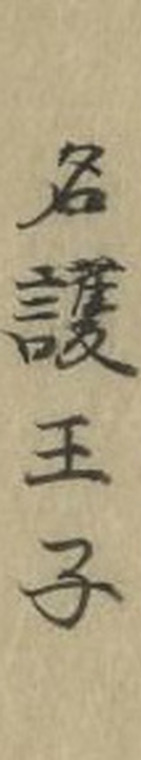名護王子
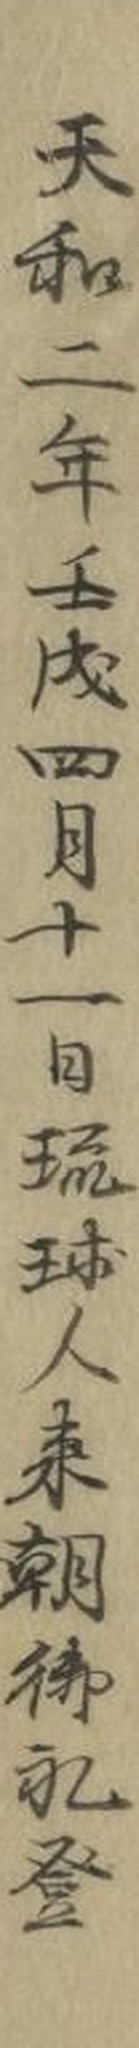天和二年壬戌四月十一日琉球人来朝御礼登
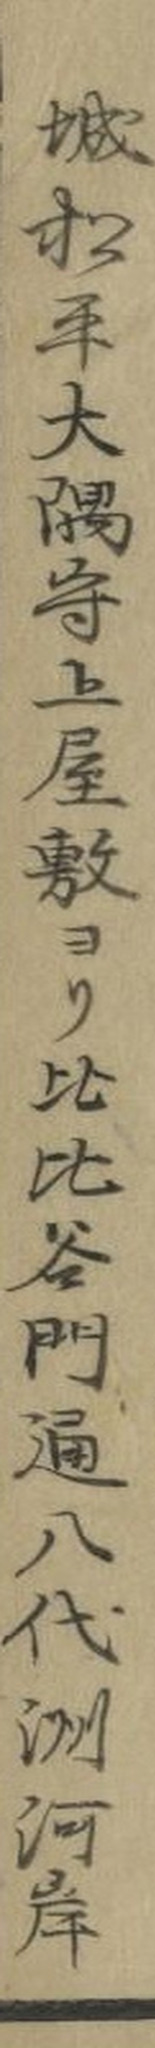城松平大隅守上屋敷ヨリ比比谷通八代洲河岸

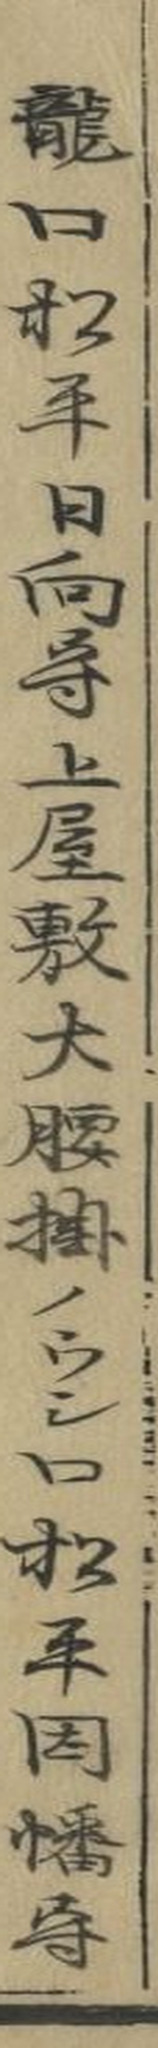龍口松平日向守上屋敷大腰掛ノウシロ松平因幡守
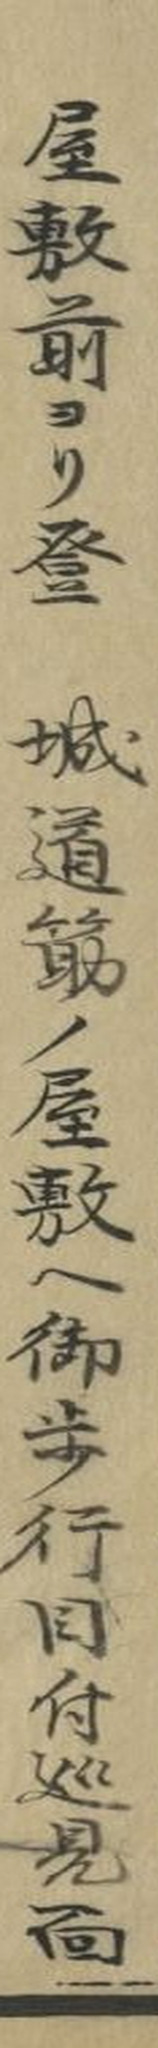屋敷前ヨリ登城道筋ノ屋敷へ御歩行目付巡見面
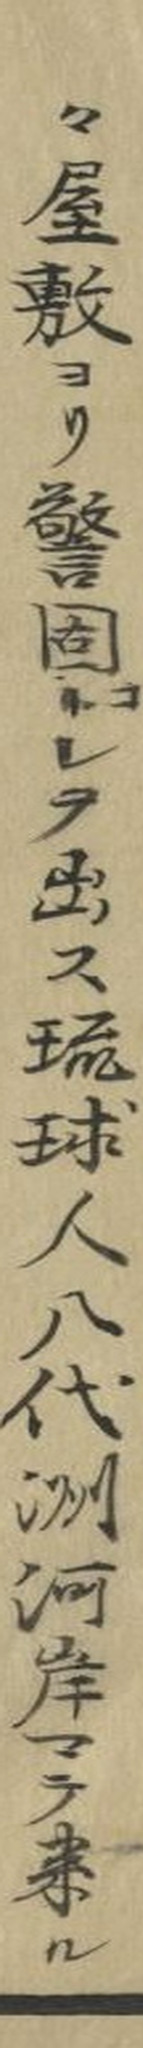々屋敷ヨリ警固コレヲ出ス琉球人八代洲河岸マテ来ル
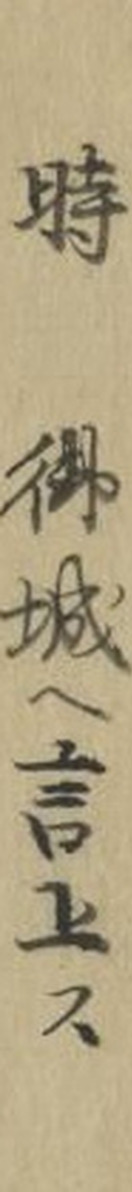時御城へ言上ス
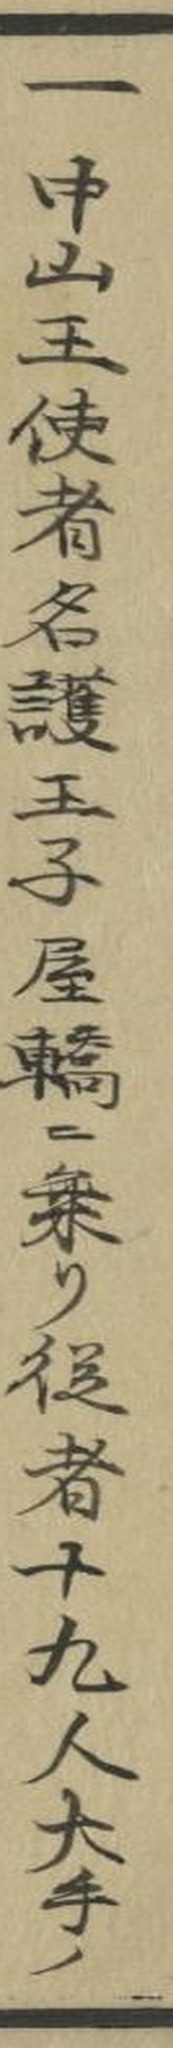一中山王使者名護王子屋轎ニ乗り従者十九人大手ノ
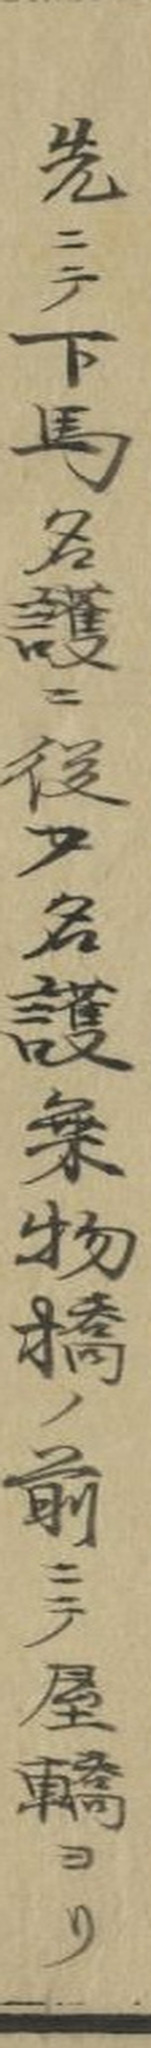先似ニテ下馬名護従フ名護乗物橋ノ前ニテ屋轎ヨリ
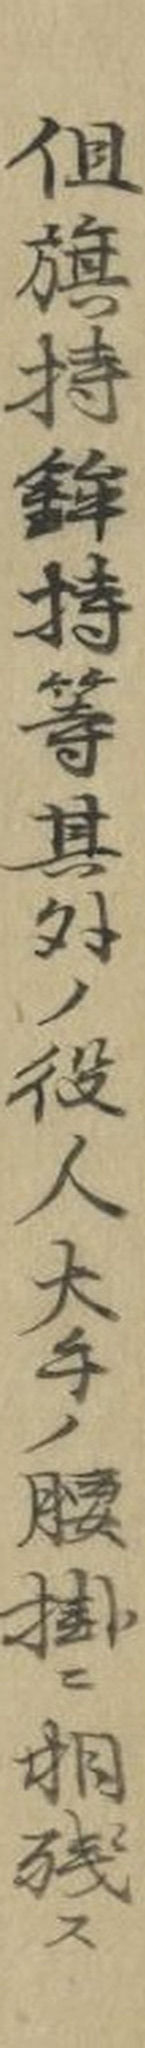但旗持鋒持等其外ノ役人大手ノ腰掛ニ相残ス
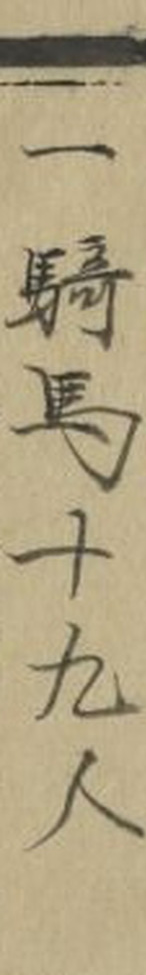一騎馬十九人
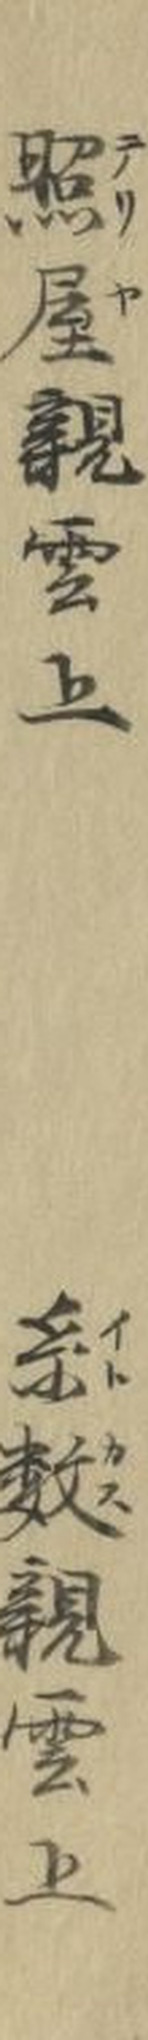照屋親雲上糸数親雲上
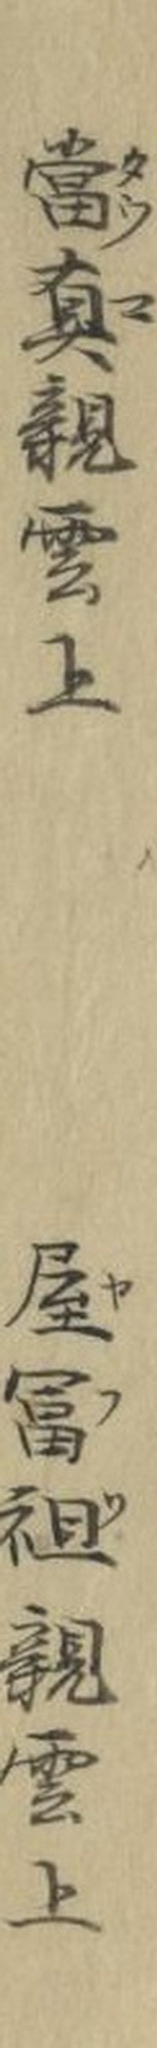當真親雲上屋冨祖親雲上
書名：琉球往来（下）
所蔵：University of the Ryukyus Library
